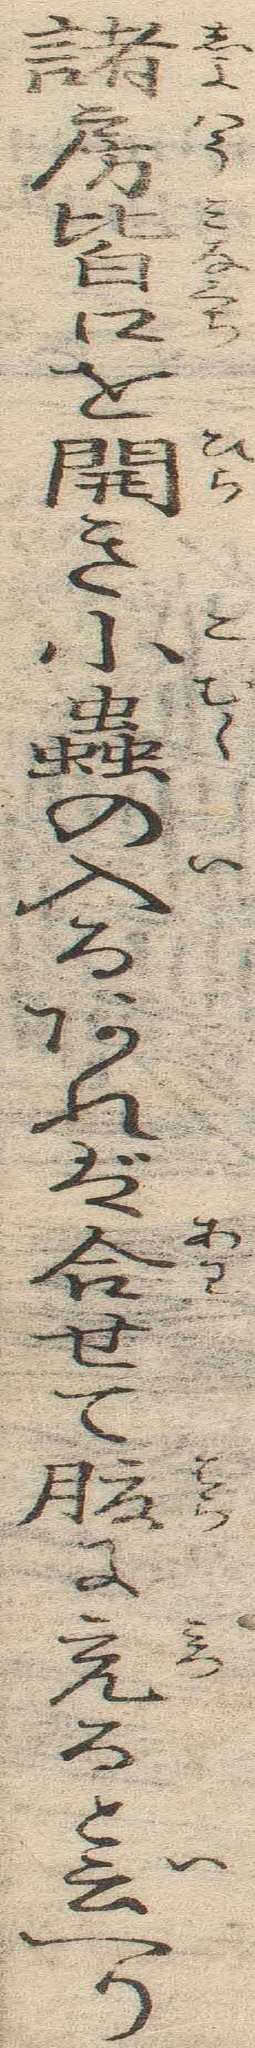諸房皆口を開き小虫の入るあれば合せて腹に充ると云へり

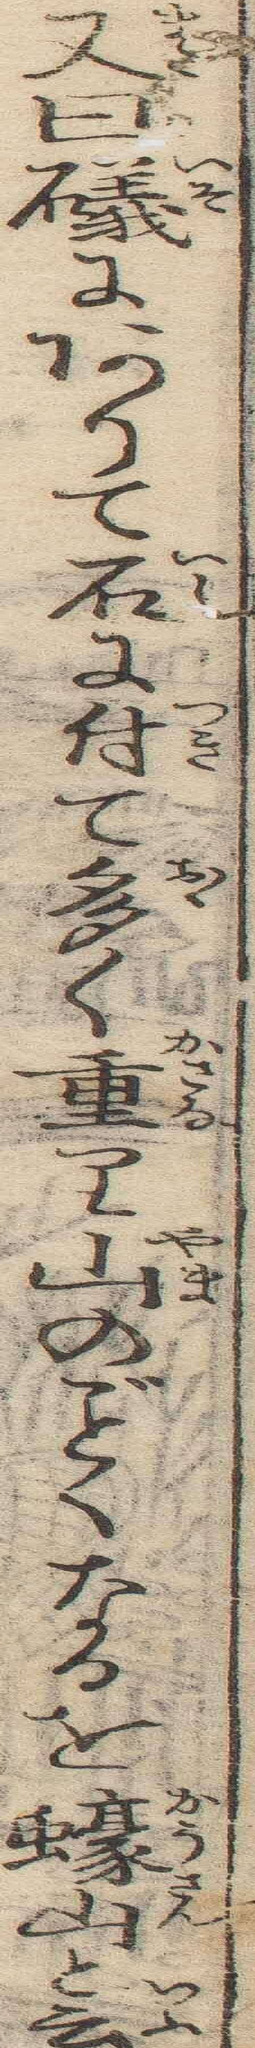又曰礒にありて石に付て多く重り山のごとくなるを蠔山と云
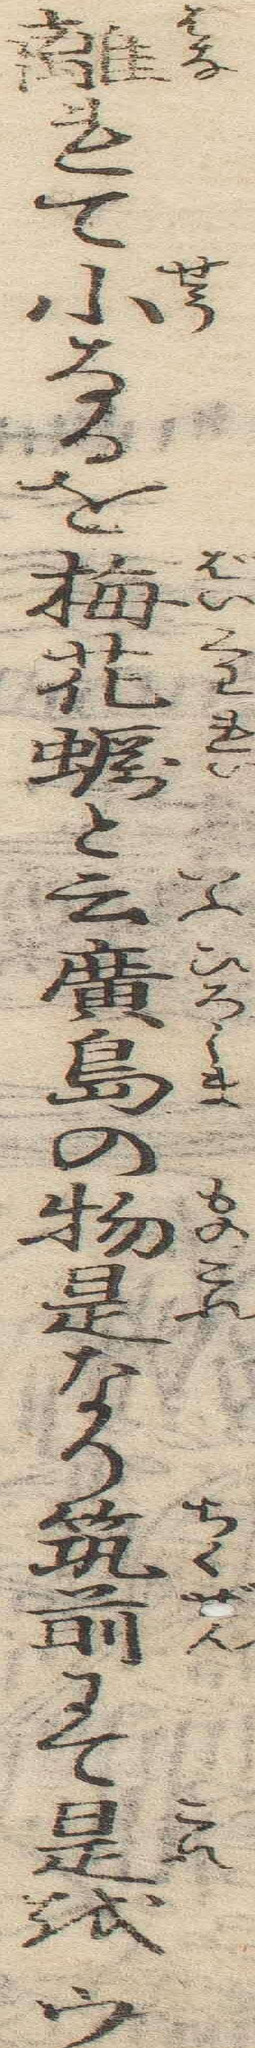離れて小なるを梅花蠣と云広島の物是なり筑前にて是をウ
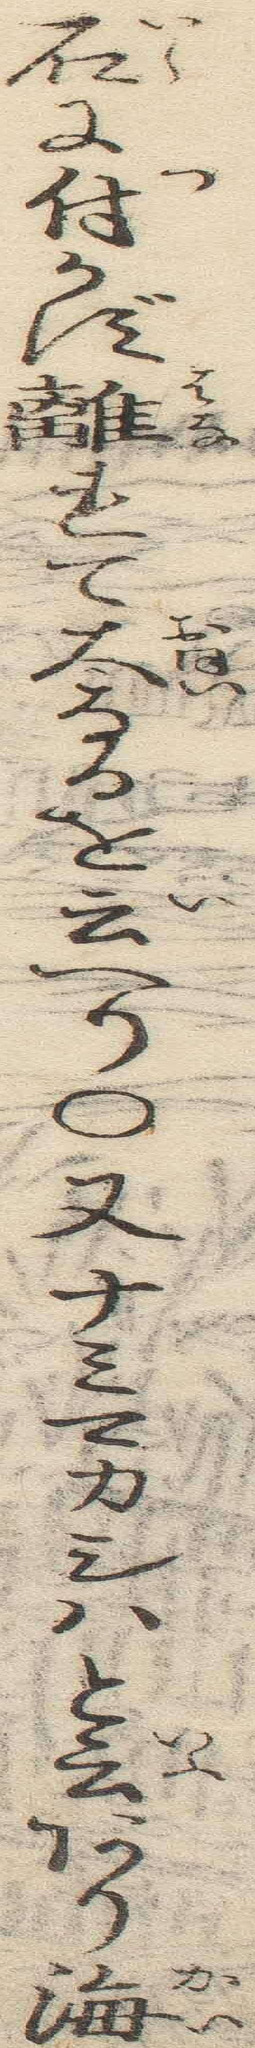石に付かず離れて大なるを云へり○又ナミマカシハと云あり海
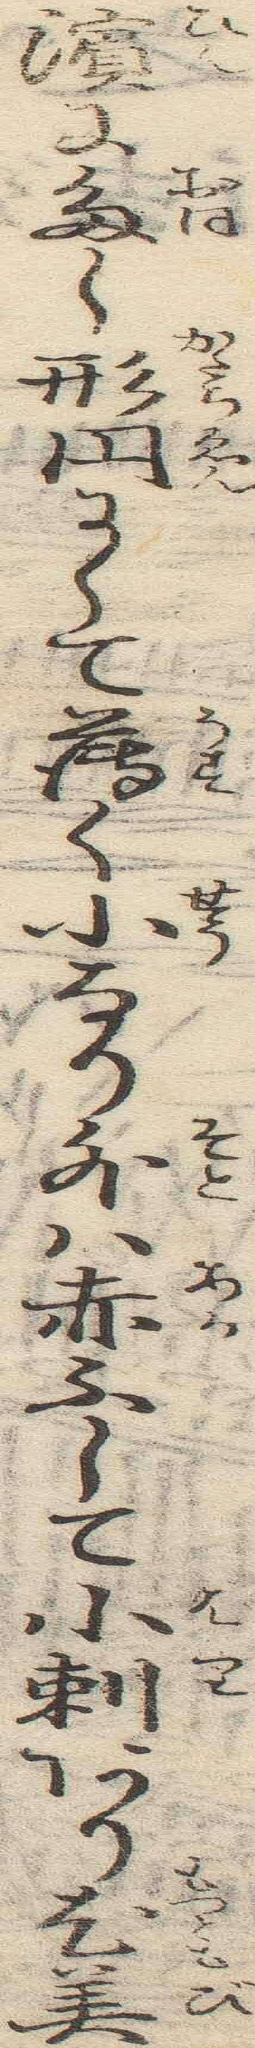浜に多し形円にして薄く小なり外は赤ふして小刺あり尤美
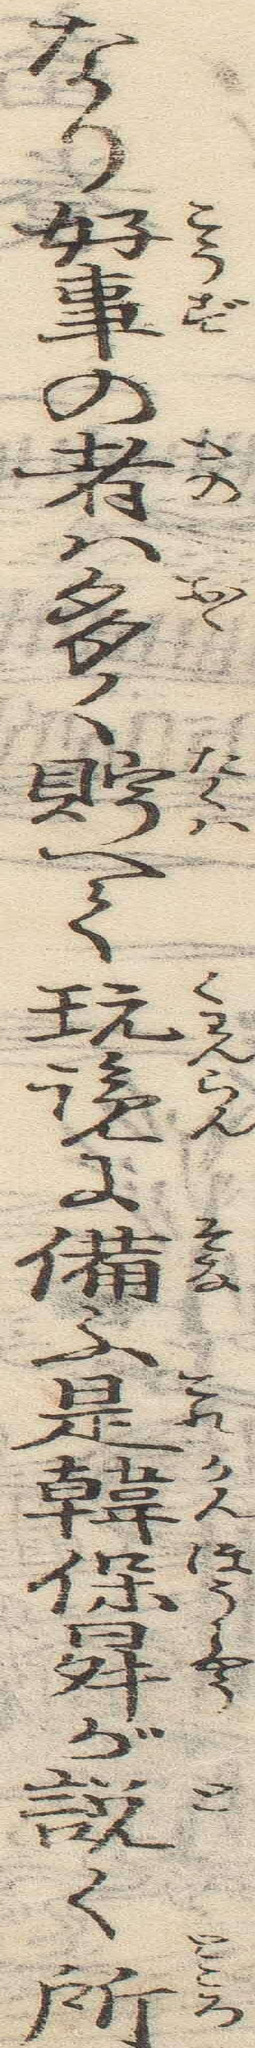なり好事の者は多く貯へて玩覧に備ふ是韓保昇が説く所
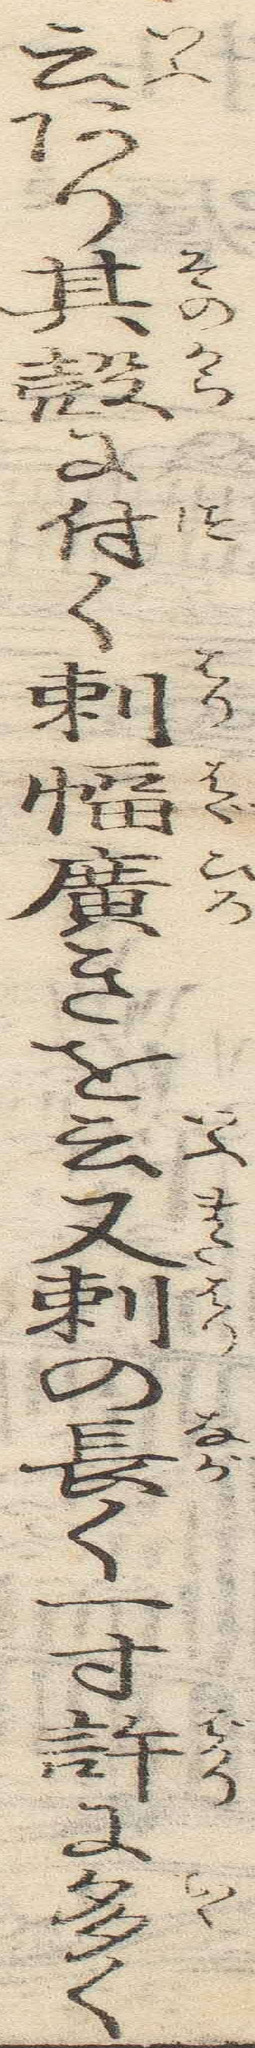云あり其殻に付く刺幅広きを云又刺の長く一寸許に多く
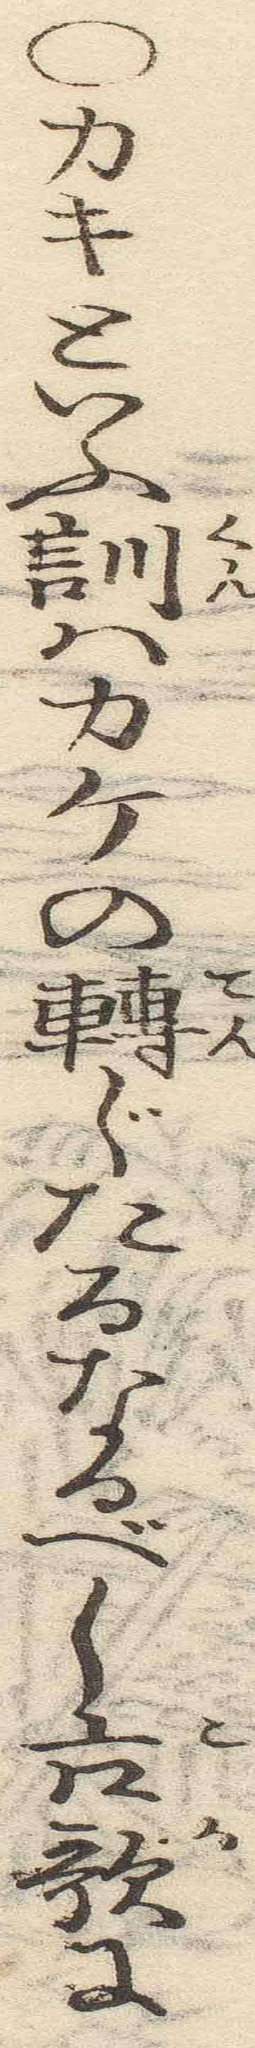○カキといふ訓はカケの転じたるなるべし古歌に
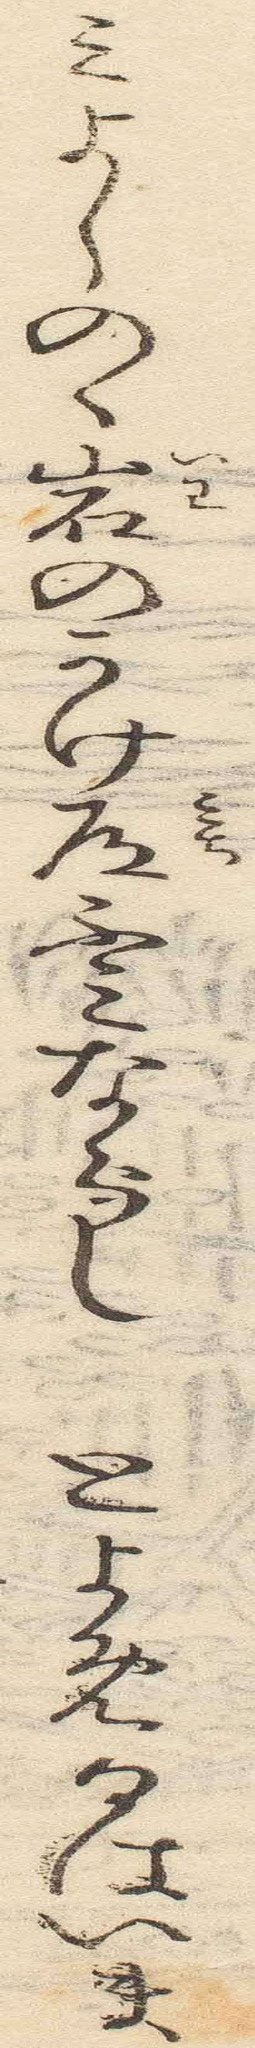みよしのゝ岩のかけ道ふみならしとよめるはいま
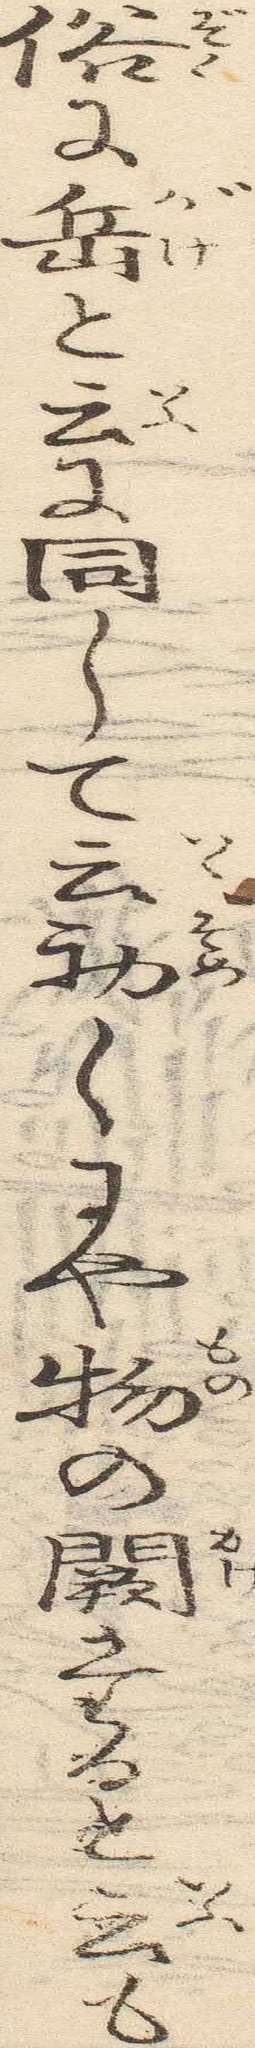俗に岳と云に同して云初しにや物の闕たると云も
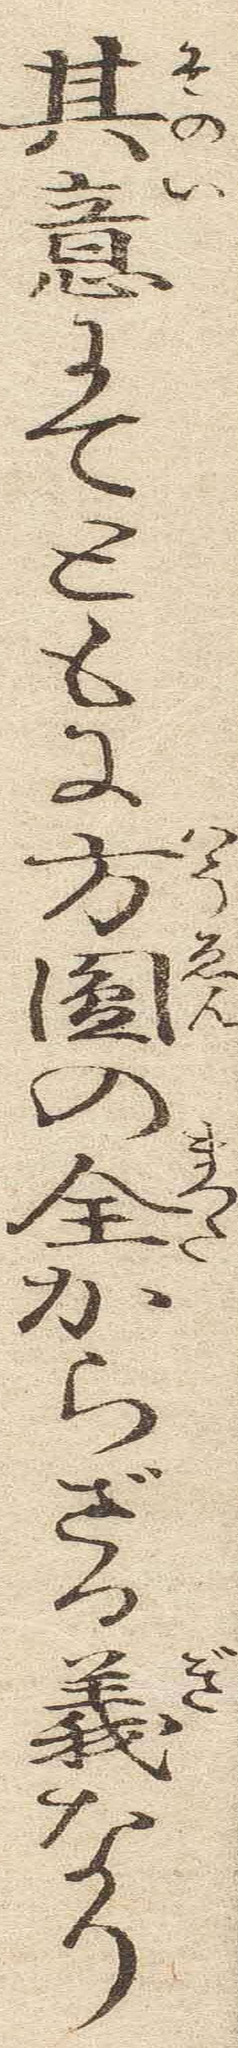其意にてともに方円の全からざる義なり
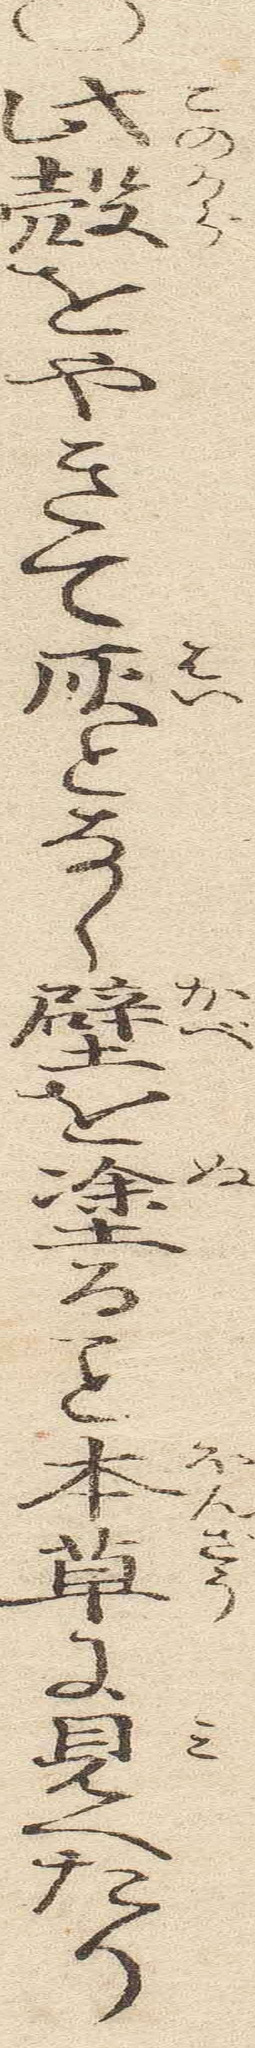○此殻をやきて灰となし壁を塗ること本草に見へたり
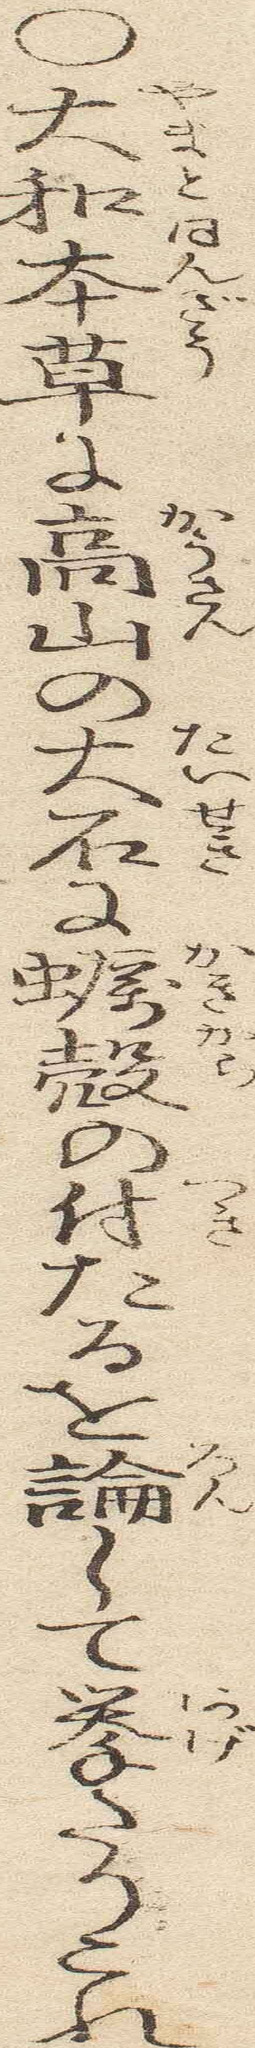○大和本草に高山の大石に蠣殻の付たるを論して挙たりこれ
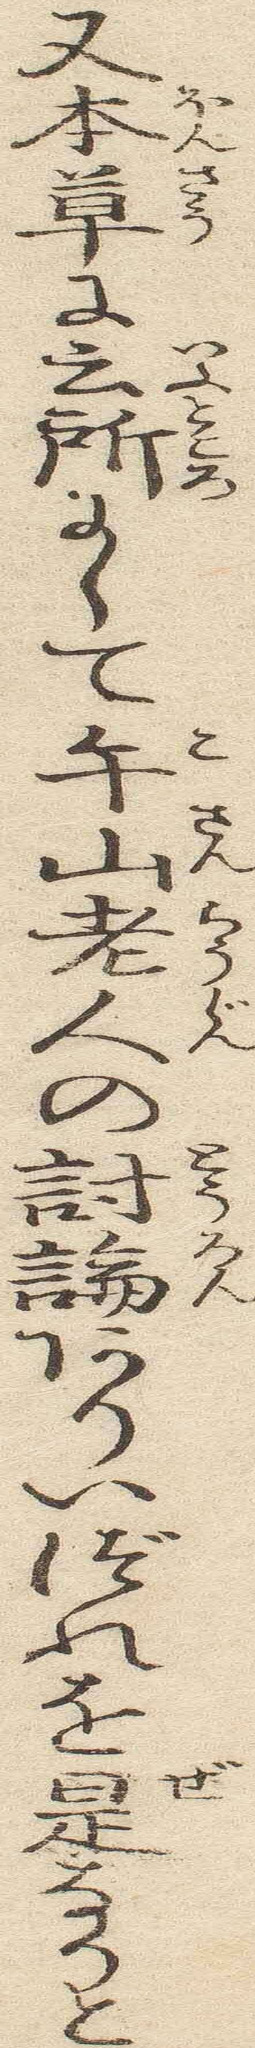又本草に云所にして午山老人の討論ありいづれを是なりと
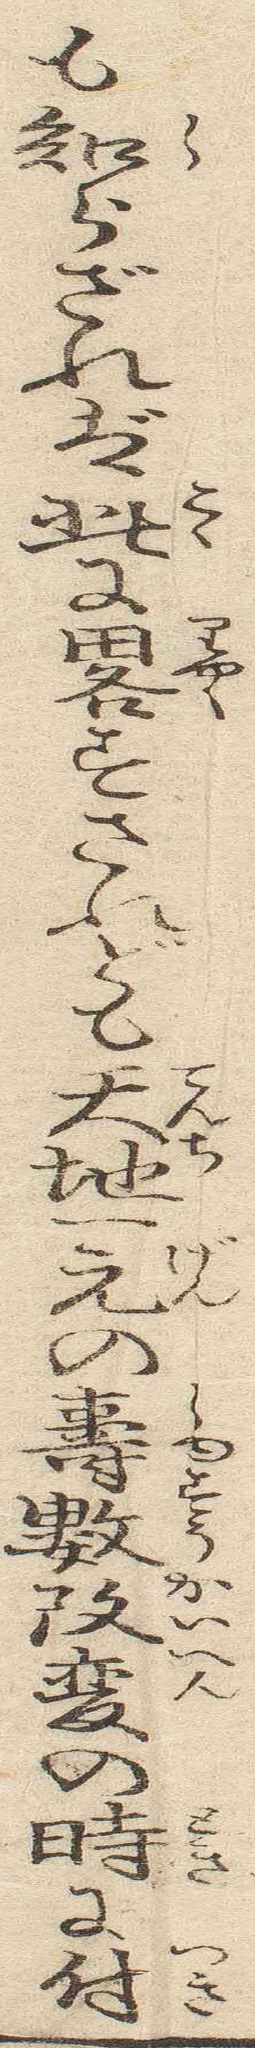も知らざれば此に略すされども天地一元の寿数改変の時に付
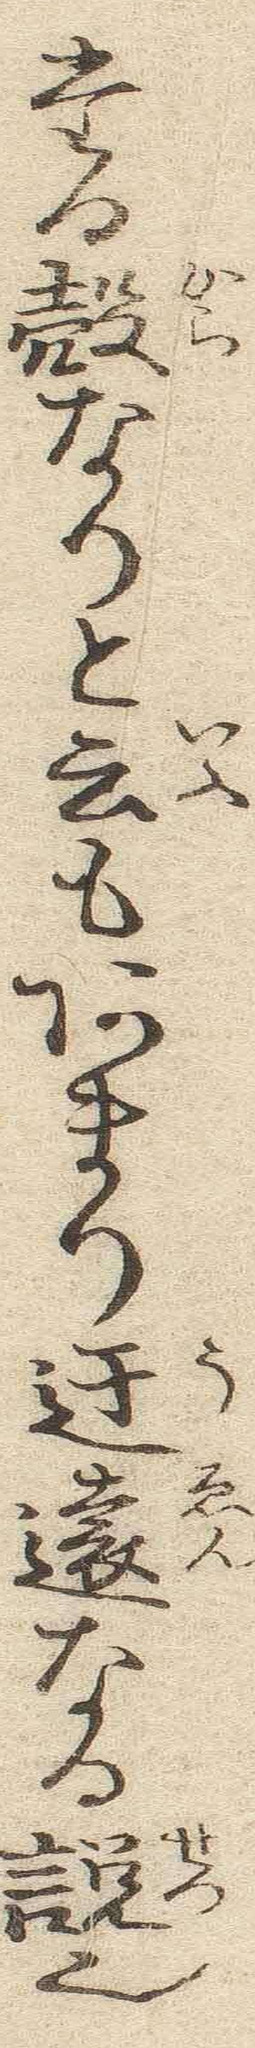たる殻なりと云もあまり迂遠なる説也
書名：日本山海名産図会
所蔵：東京学芸大学附属図書館 国文学研究資料館
